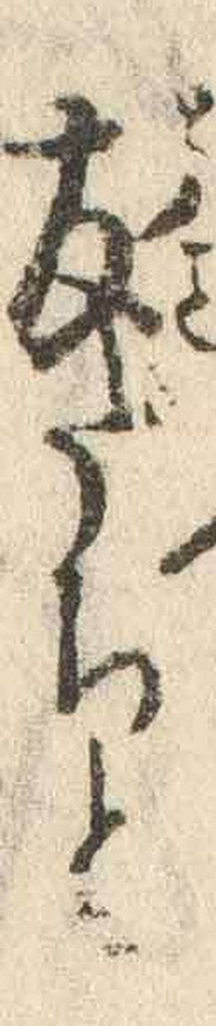友だちと
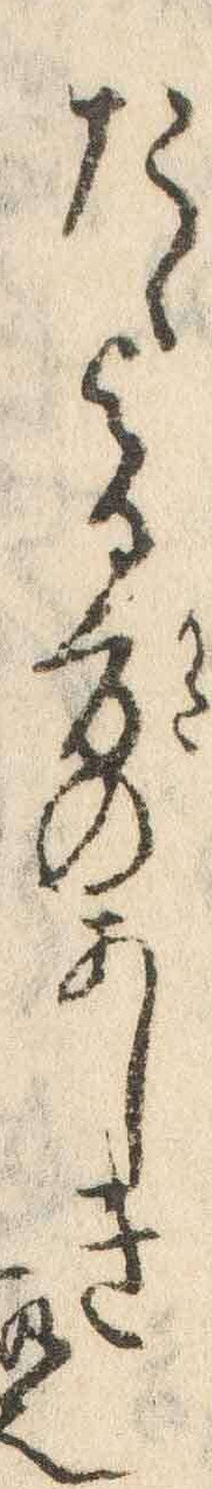たゝよる方のあしき故也
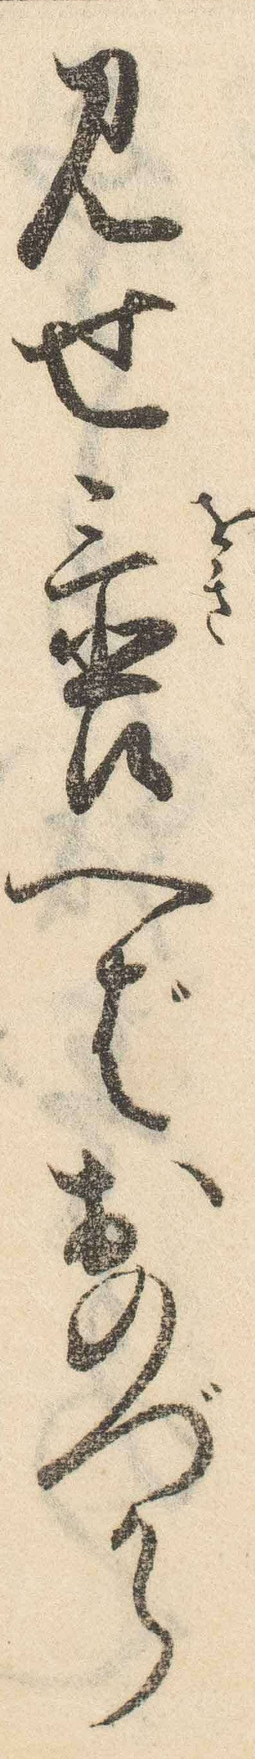見せ置候へばおのづから
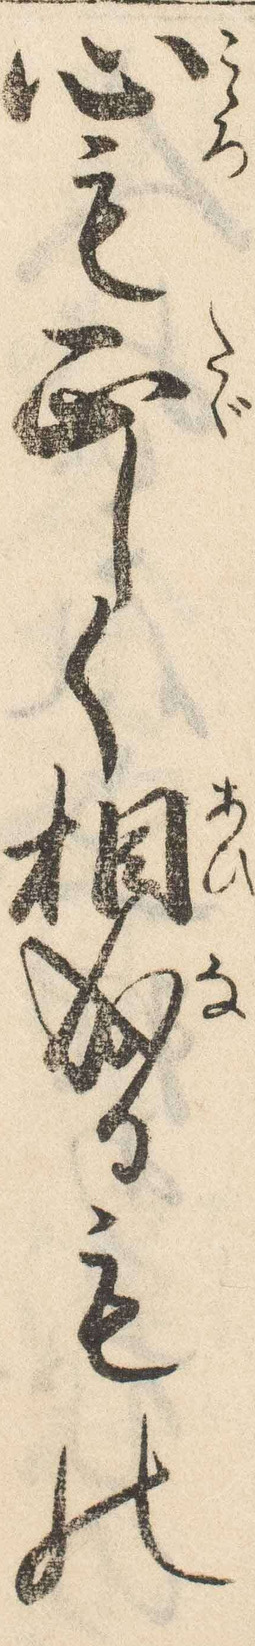心も正しく相成るもの
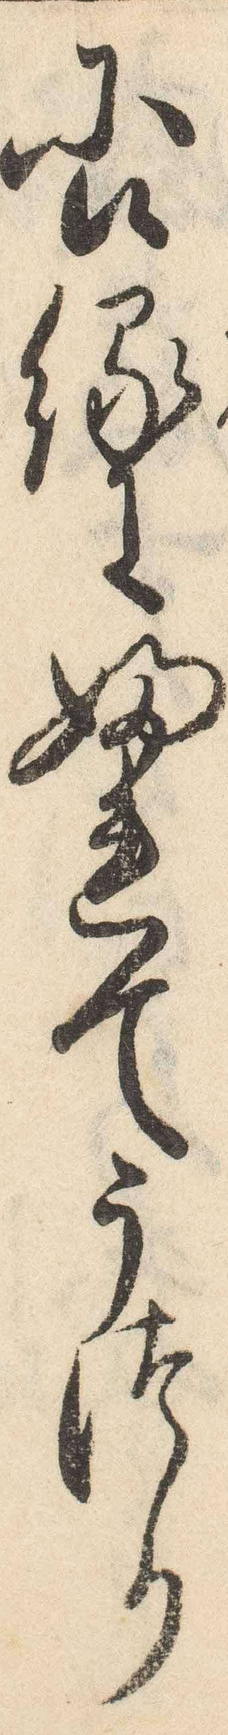に候縁にふれてうつり
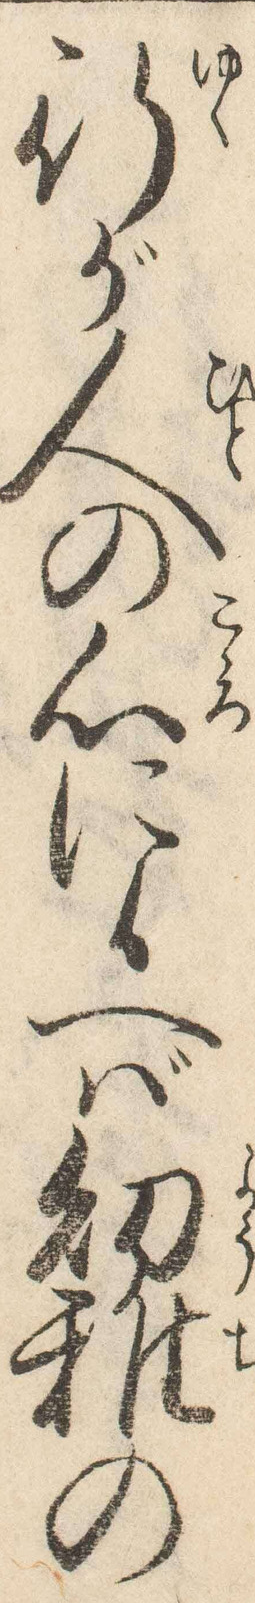行が人の心に候へば幼稚の
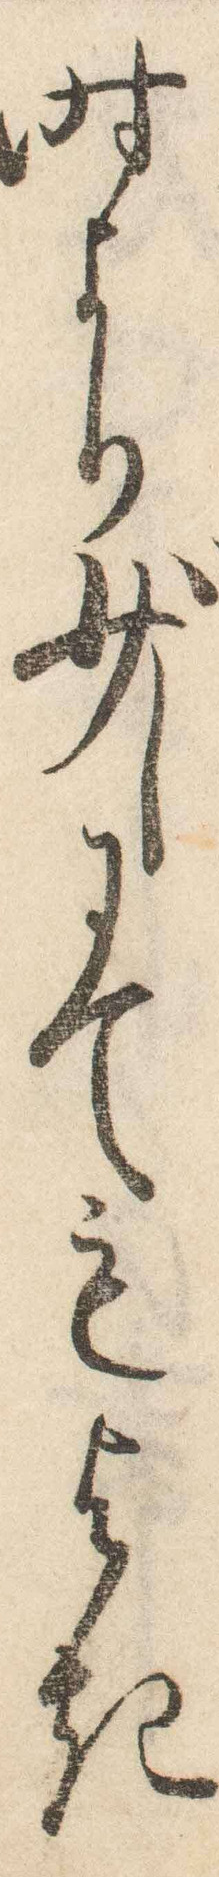時より少しにてもよき
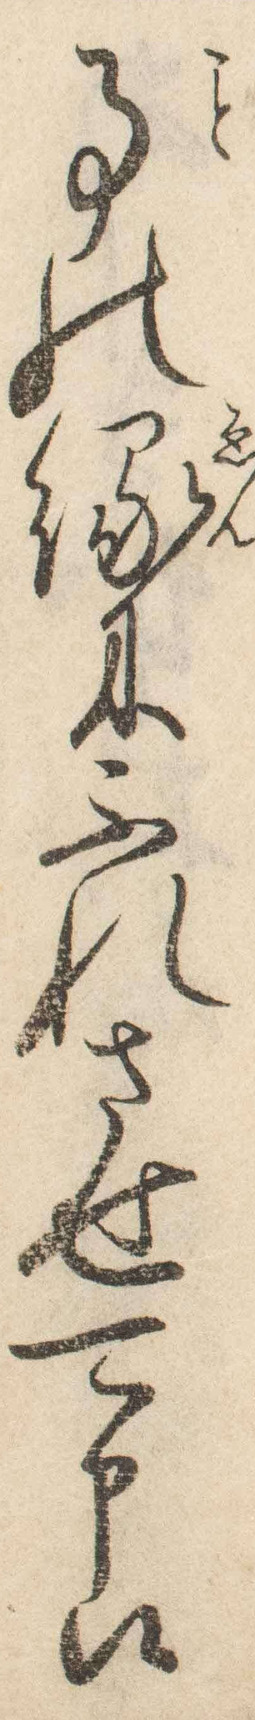事の縁にふれさせ可申候
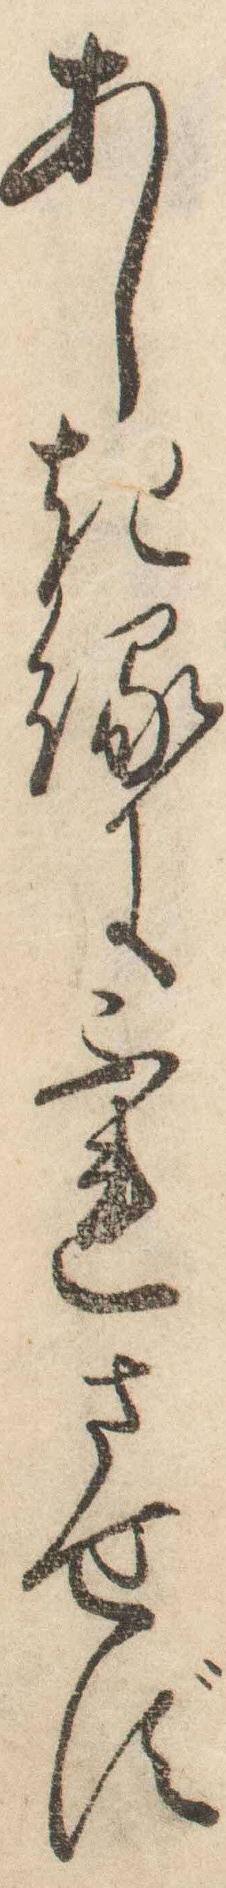あしき縁にふれさせず

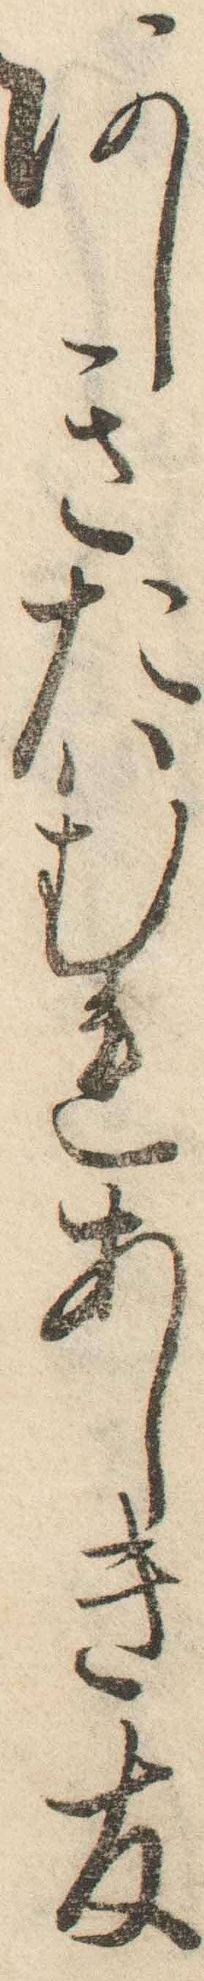あしきたはむれあしき友
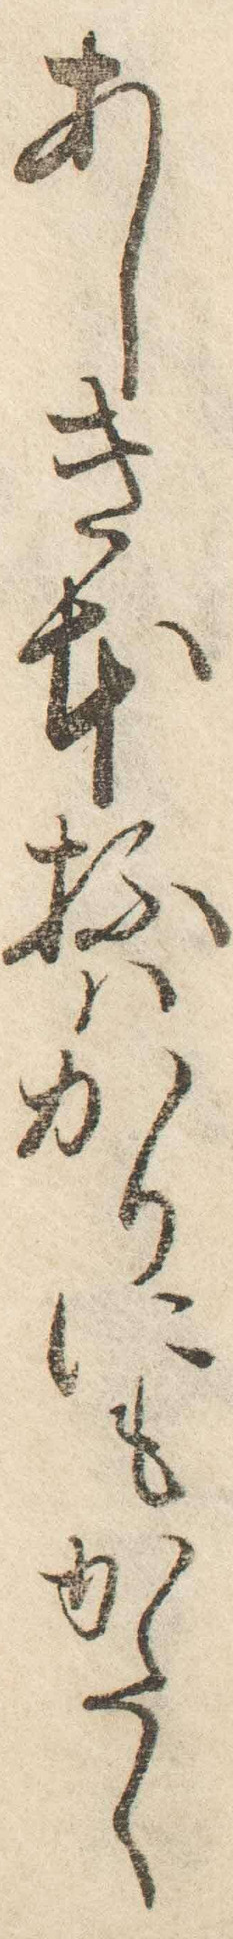あしき本抔はかりにもかたく
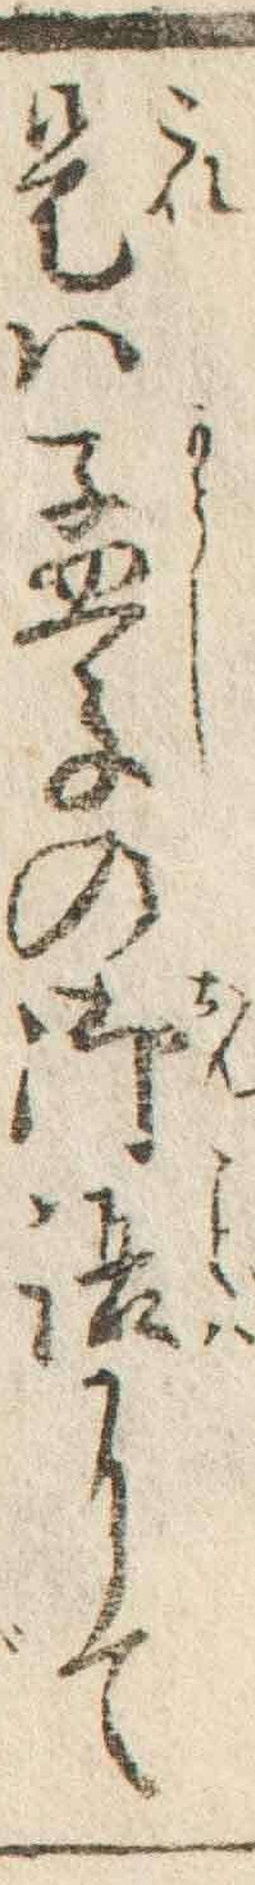是は孟子の御語にて
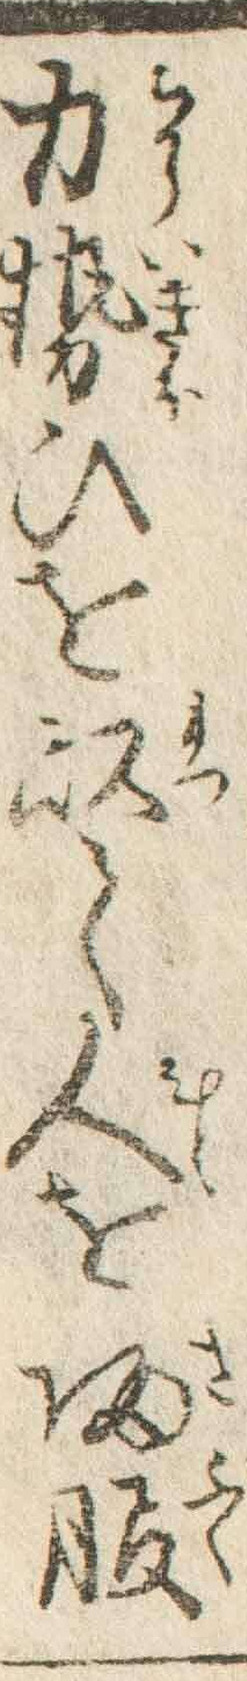力勢ひを以て人を帰服
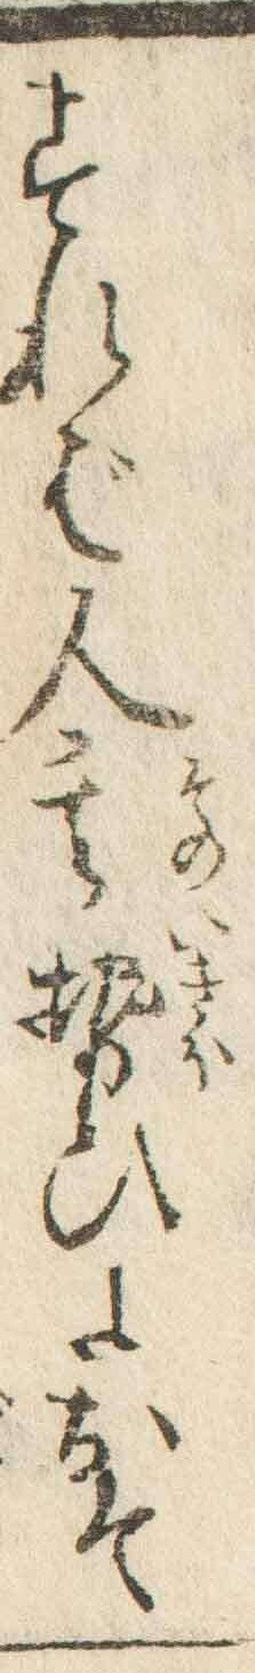すれば人其勢ひにおそ
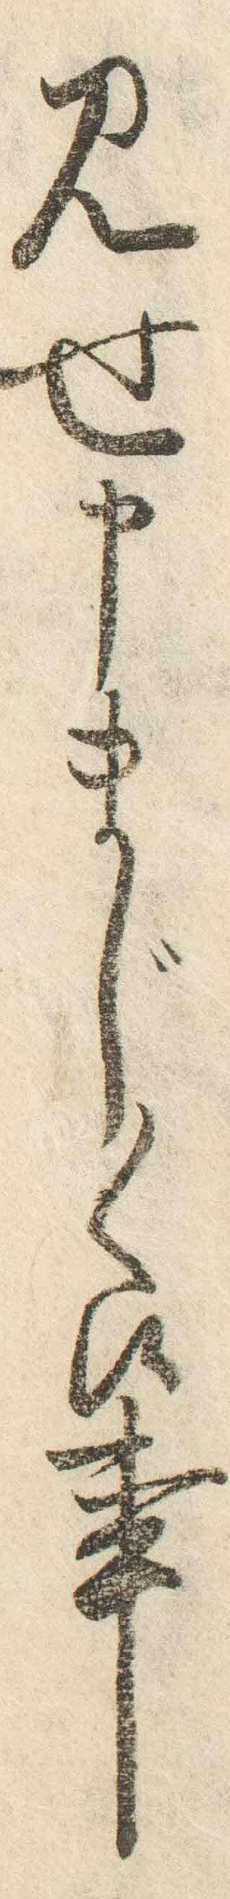見せ申まじく候事
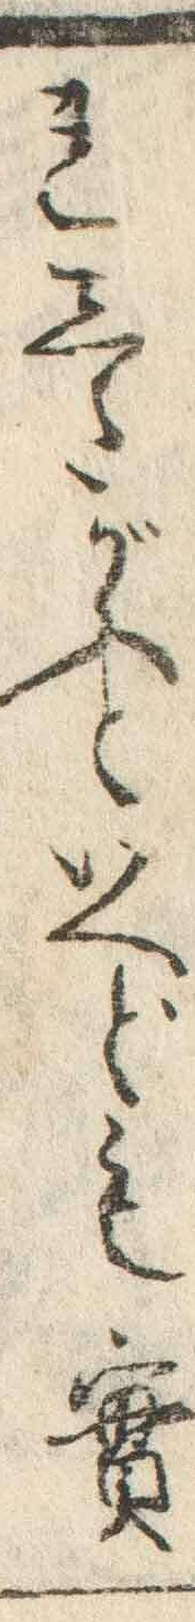れしたがふといへども実
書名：撫育草
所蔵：東京学芸大学附属図書館 国文学研究資料館
